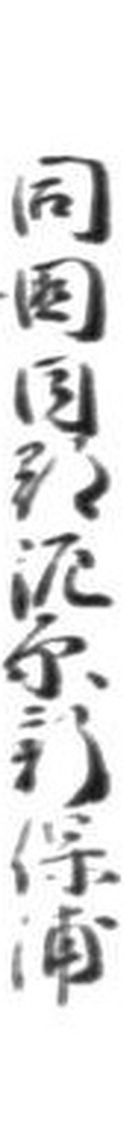同国同郡泥原新保浦

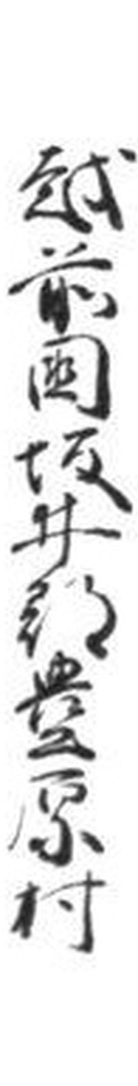越前国坂井郡豊原村
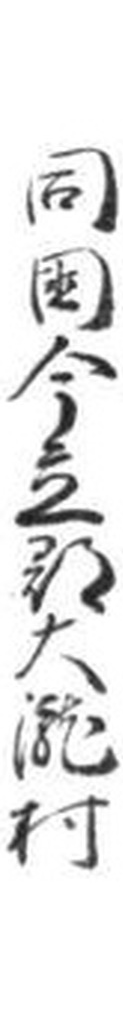同国今立郡大滝村
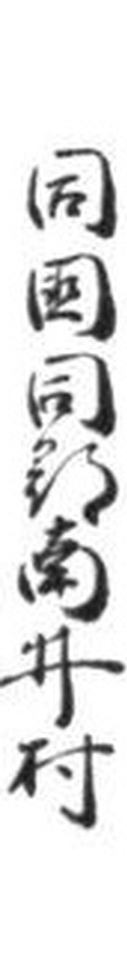同国同郡南井村
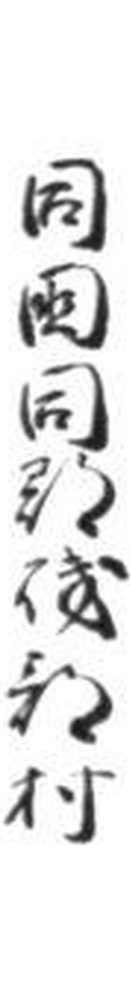同国同郡磯部村
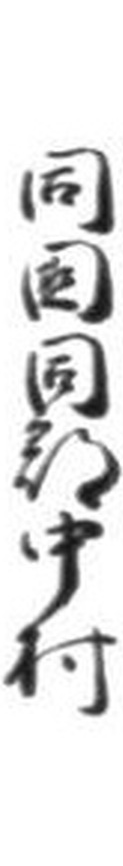同国同郡中村
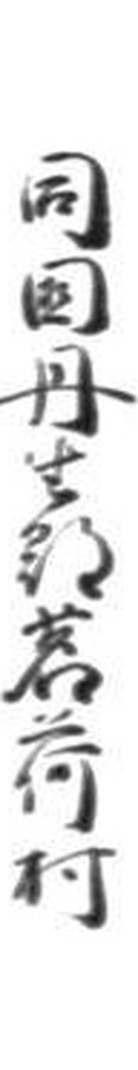同国丹生郡茗荷村
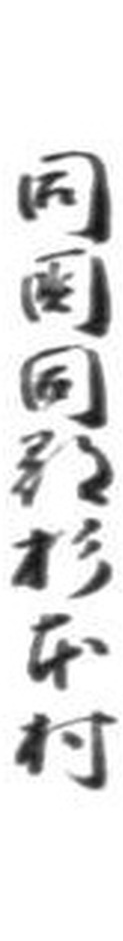同国同郡杉本村
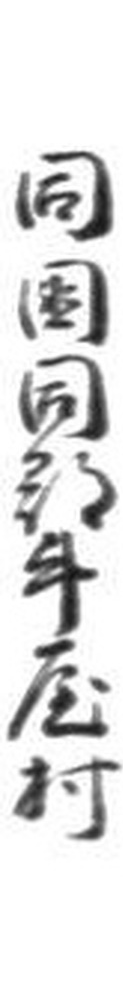同国同郡牛ヽ屋村

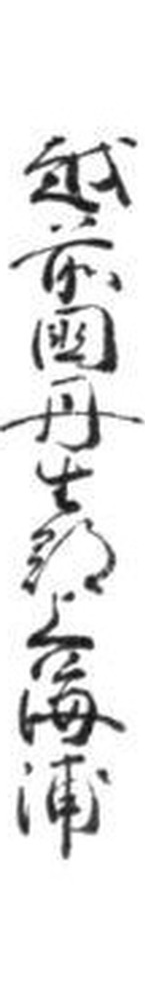越前国丹生郡上海浦
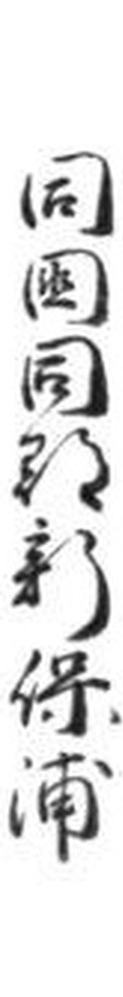同国同郡新保浦
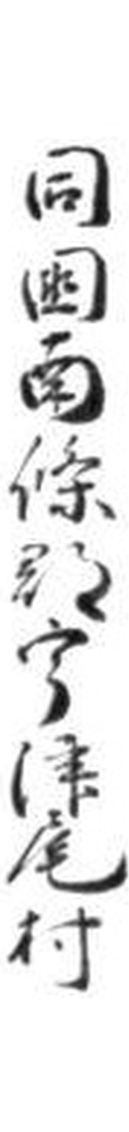同国南條郡宇津尾村
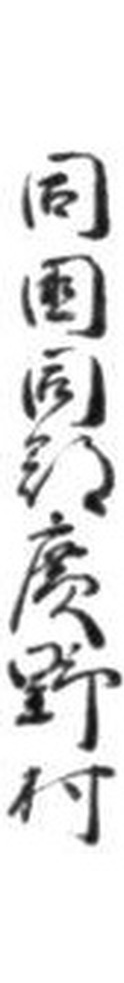同国同郡広野村
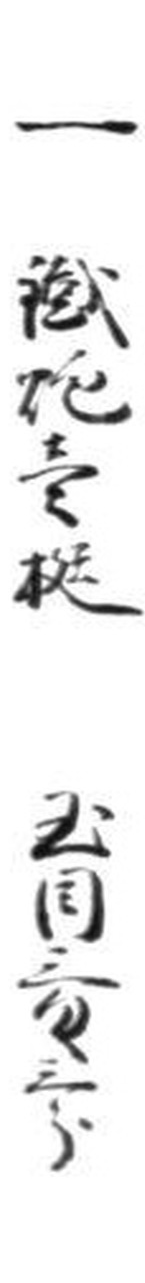一鉄炮壱挺玉目三匁弥三郎
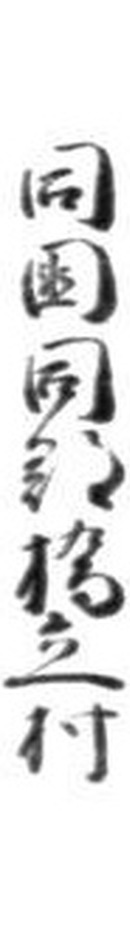同国同郡橋立村
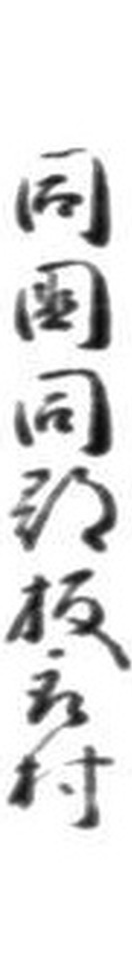同国同郡板取村
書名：家譜 十七 吉品公 従元禄元年到同二年
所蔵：福井県文書館 Fukui Prefectural Archives
